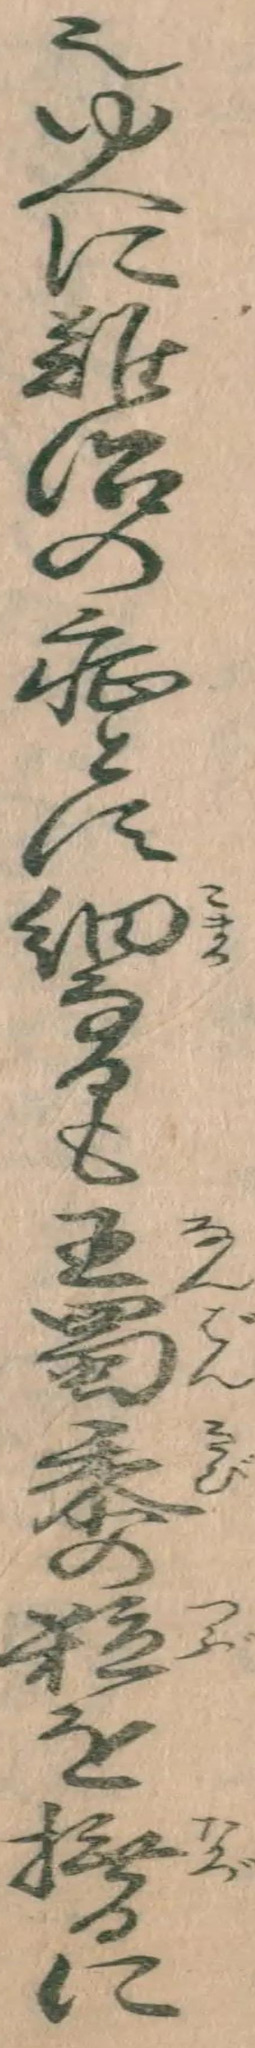也ゆへに難治の症とす細なるも王蜀黍の粒を撫るに
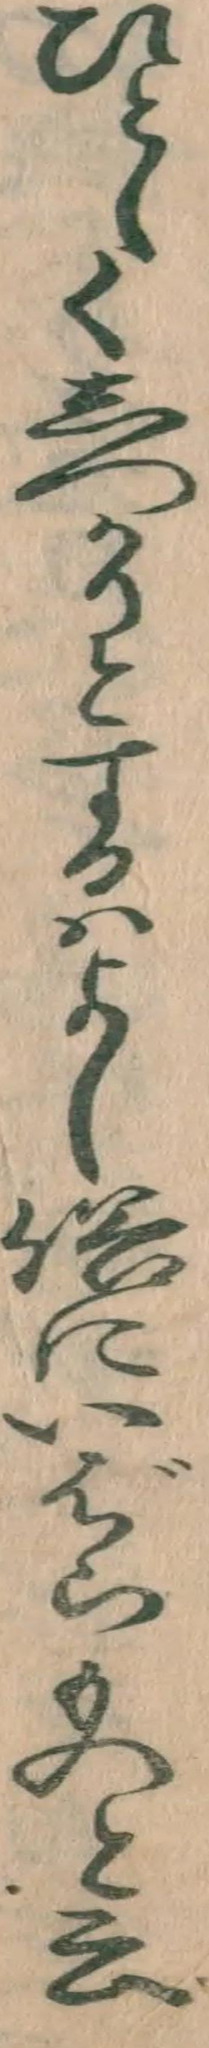ひとしくしつかりとするはよし俗にいばらものと云

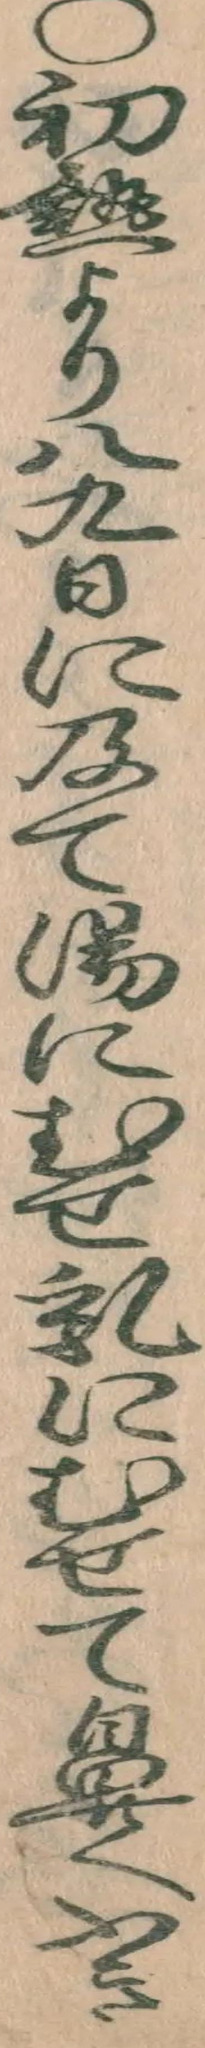○初熱より八九日に及て湯にむせ乳にむせて鼻へふき
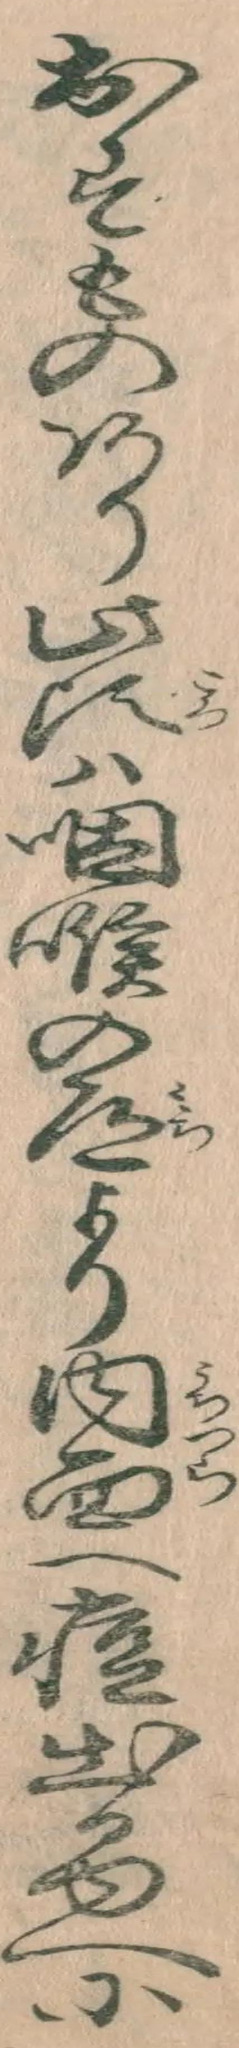出すものあり此頃は咽喉の道より内面へ痘出るゆへに
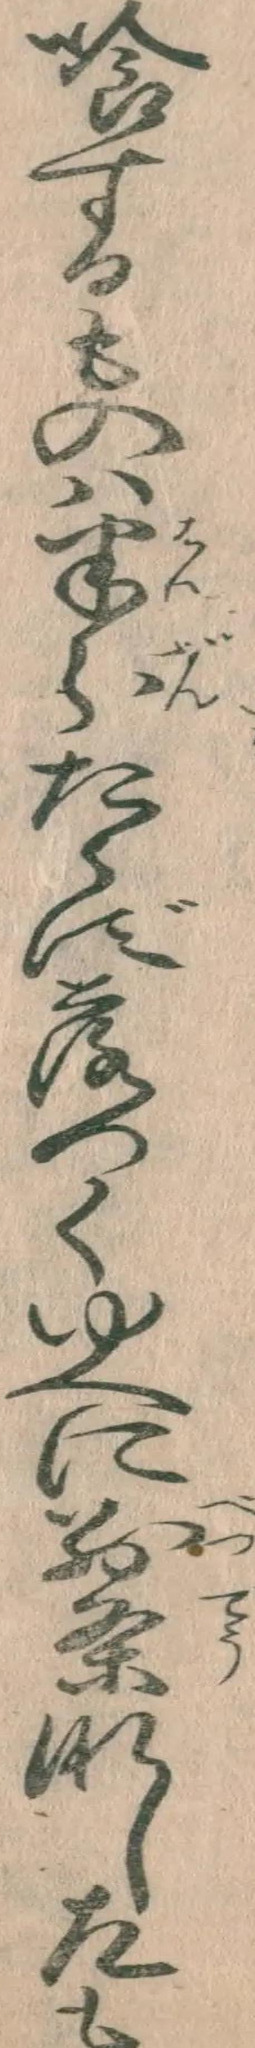喰するものは半分たらず落つくゆへに別条なし尤も
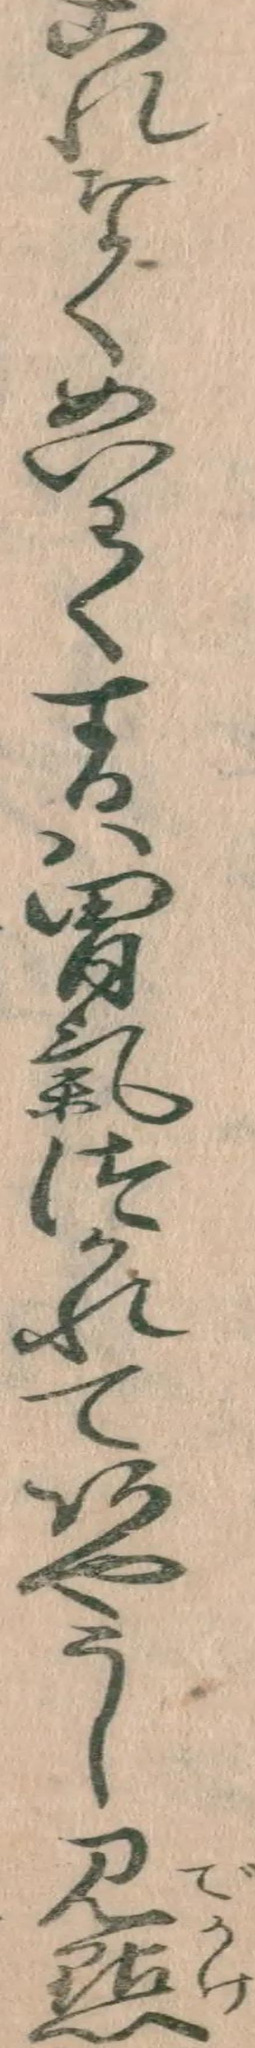これなくめいわくするは胃気つかれてああうし見点
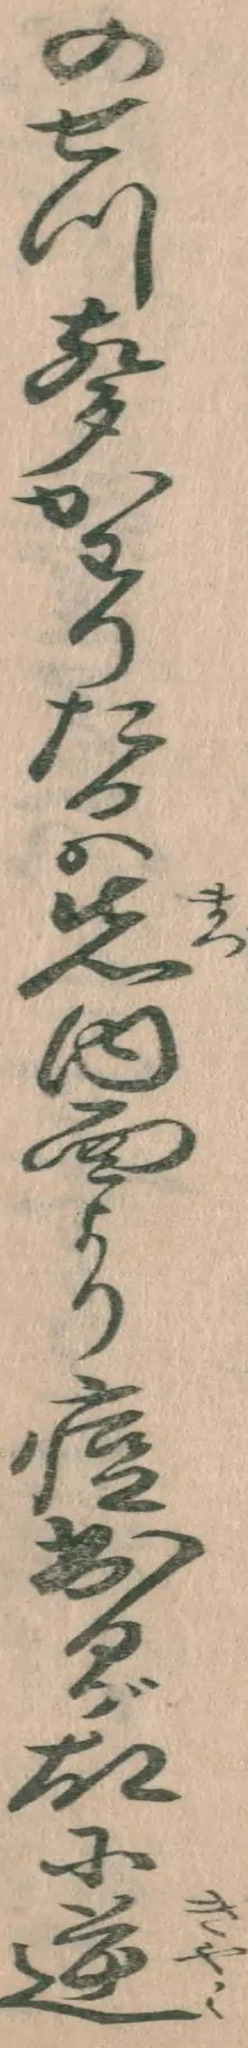のせつ声かわりたるは先内面より痘出るが故に逆
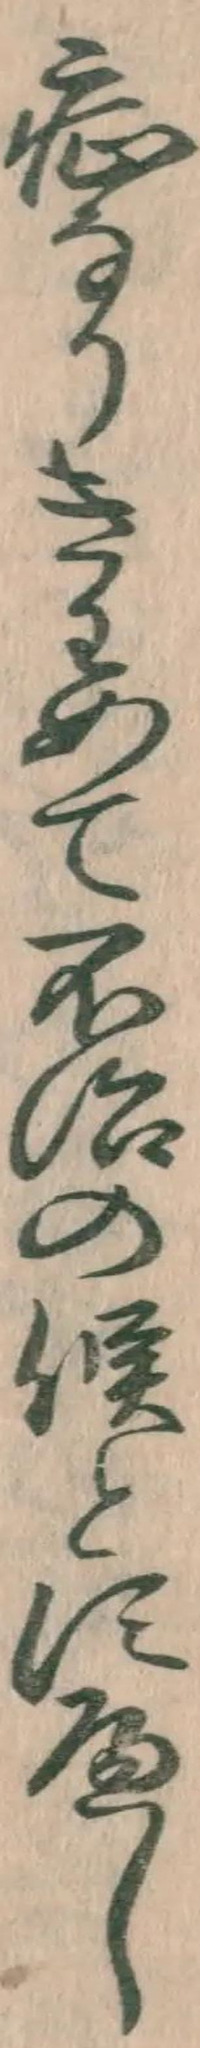症なりきわめて不治の候とすへし
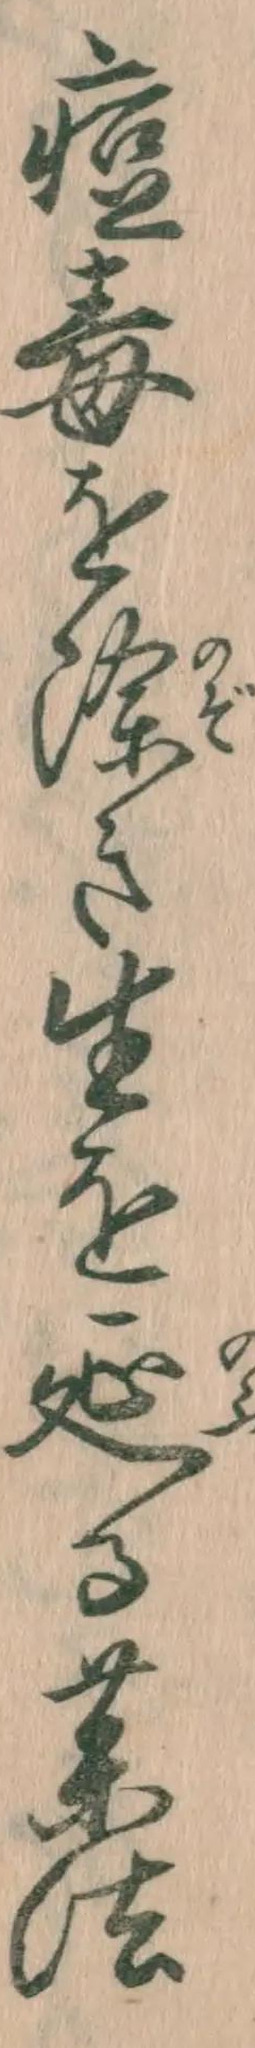痘毒を除き生を延る薬法
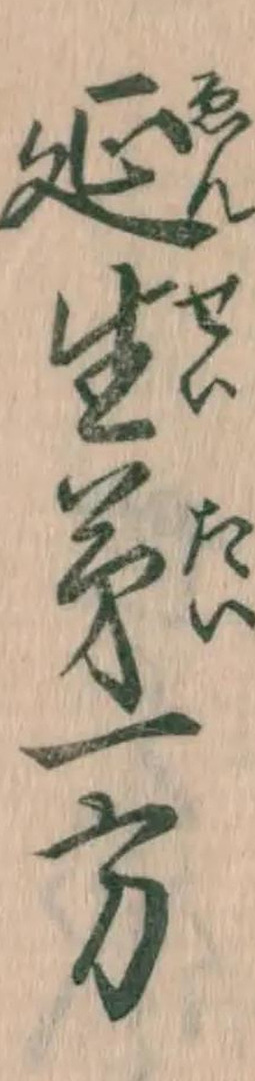延生第一方
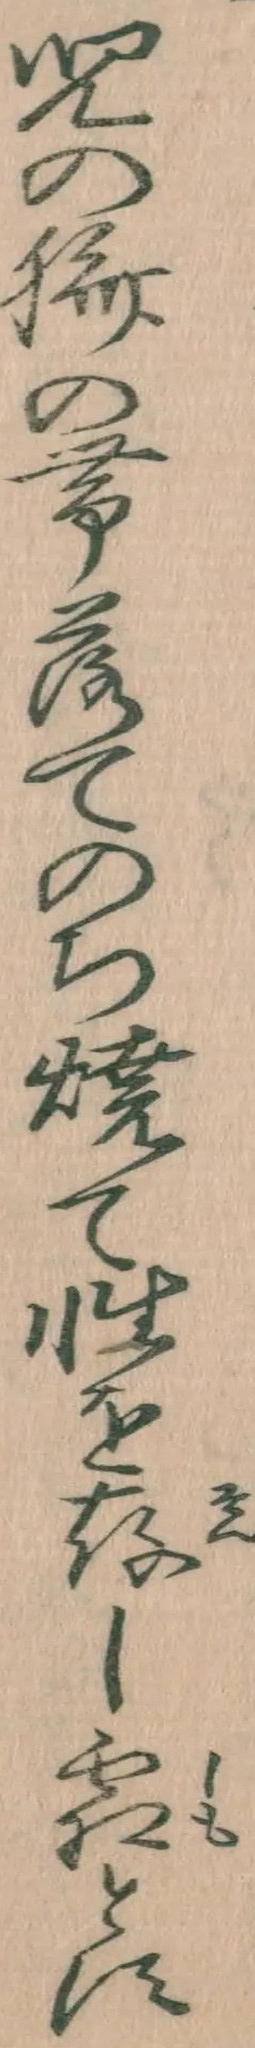児の臍の帯落てのち焼て性を存し霜とす
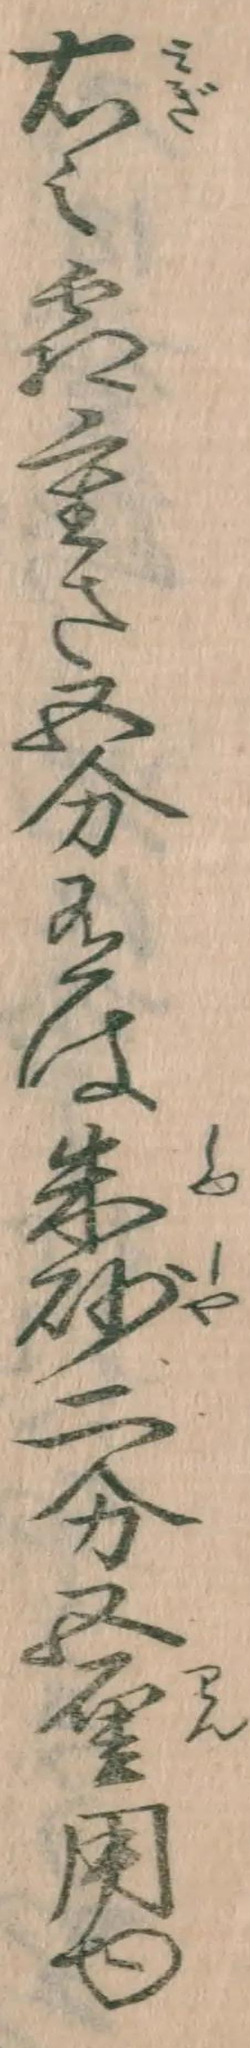右之霜重さ五分有は朱砂二分五厘用ゆ
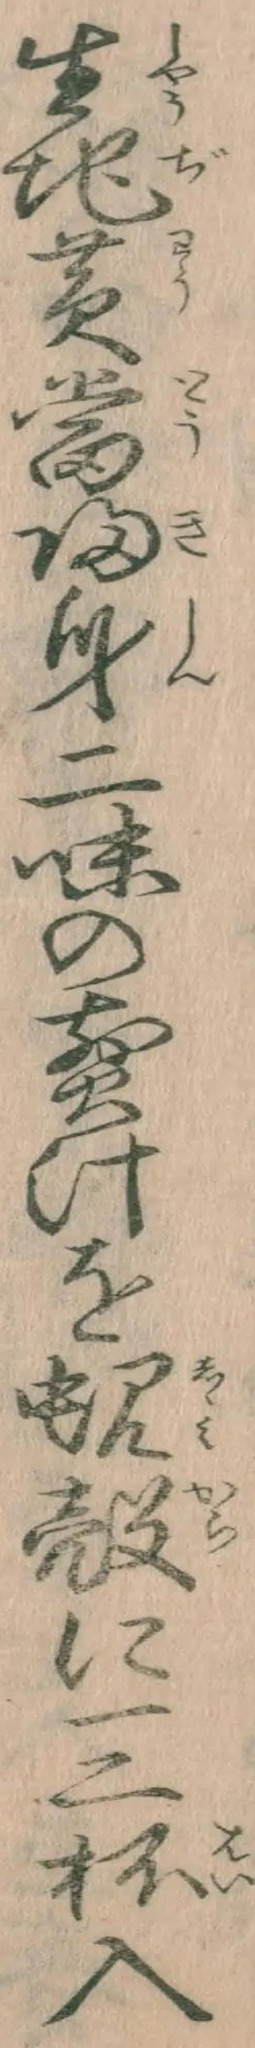生地黄当帰身二味の煎汁を蜆殻に一二杯入
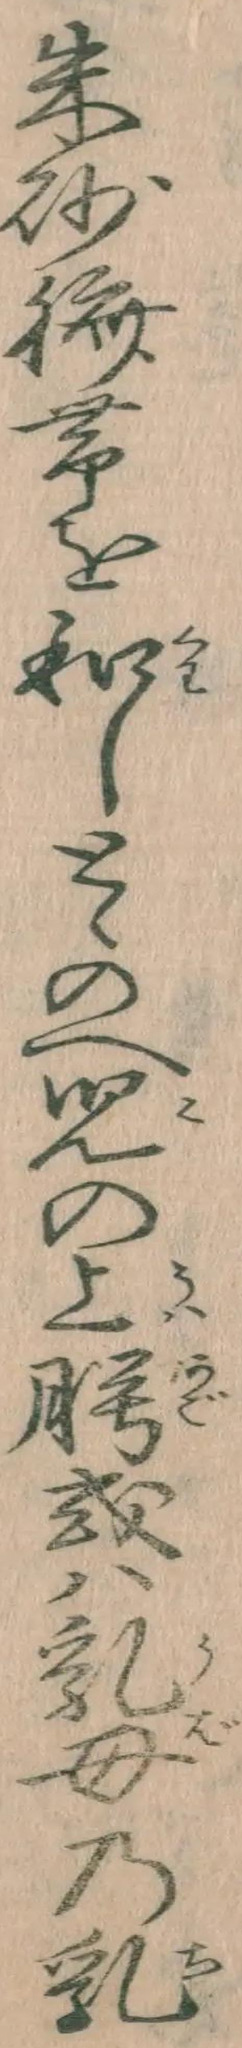朱砂臍帯を和しとゝのへ児の上腭或は乳母の乳
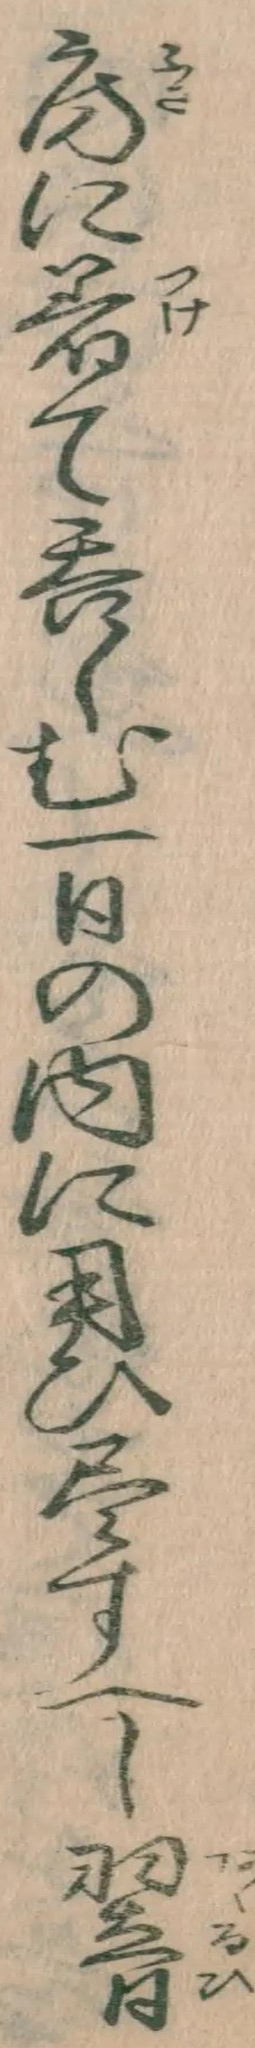房に着て呑しむ一日の内に用ひ尽すへし翌日
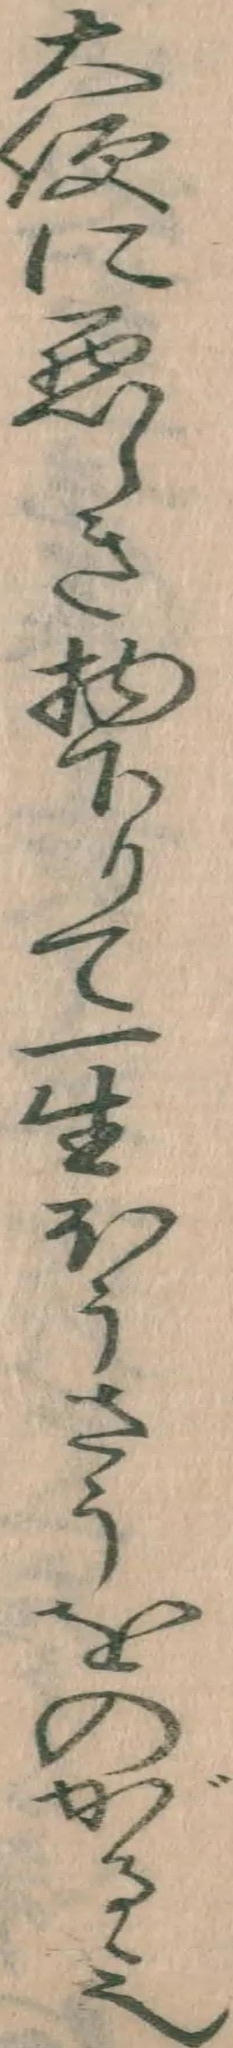大便に悪しき物下りて一生ほうさうをのがるゝ也
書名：痘家初心問答
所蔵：国立国会図書館 National Diet Library, JAPAN
